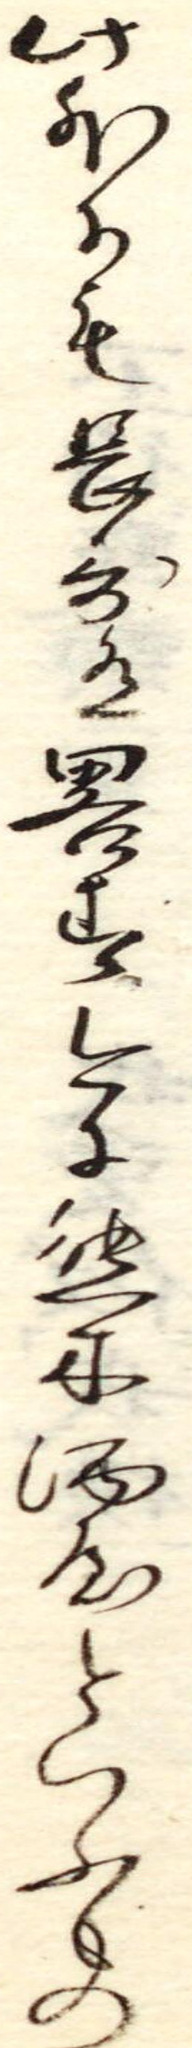此外にも長哥有略す今に熊木坂屋といふもの
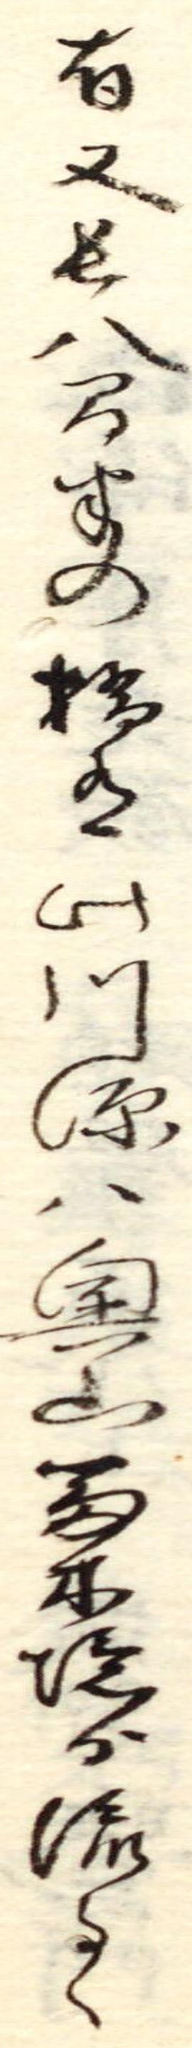有又長八間半の橋有此川源は奥山留木境ゟ流るゝ
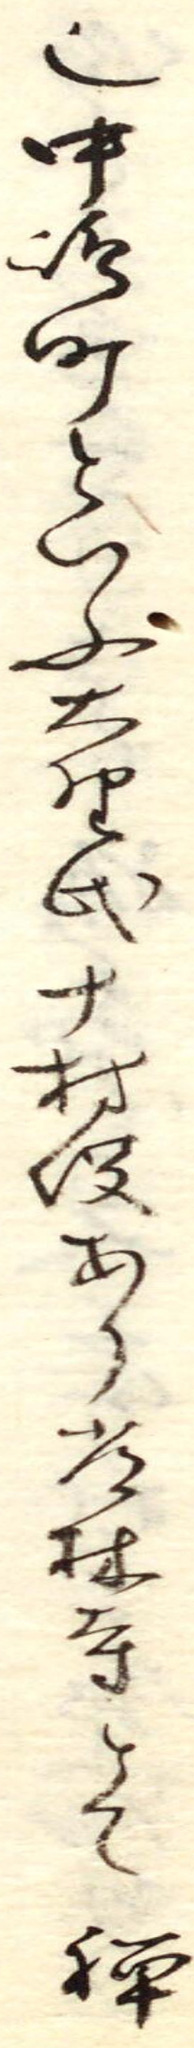也中嶋町といふ大野氏十村役あり常林寺とて禅
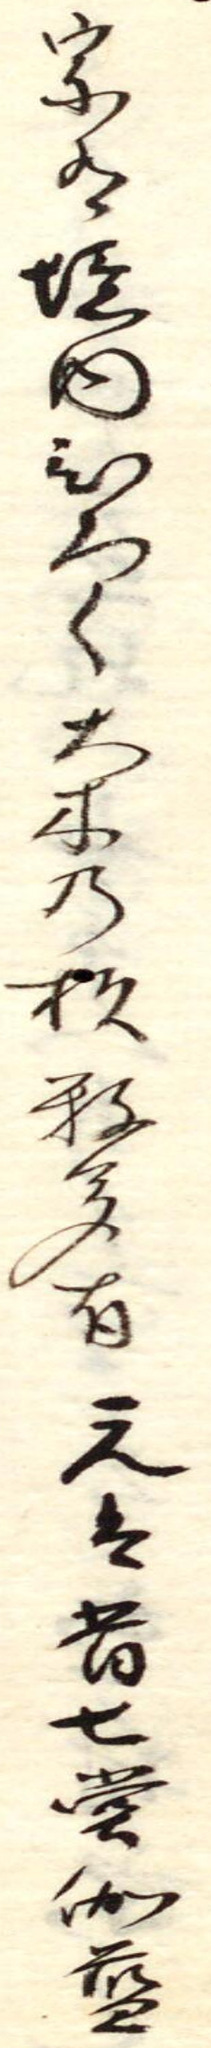宗有境内ひろく大木の杉数多有元は昔七堂伽藍
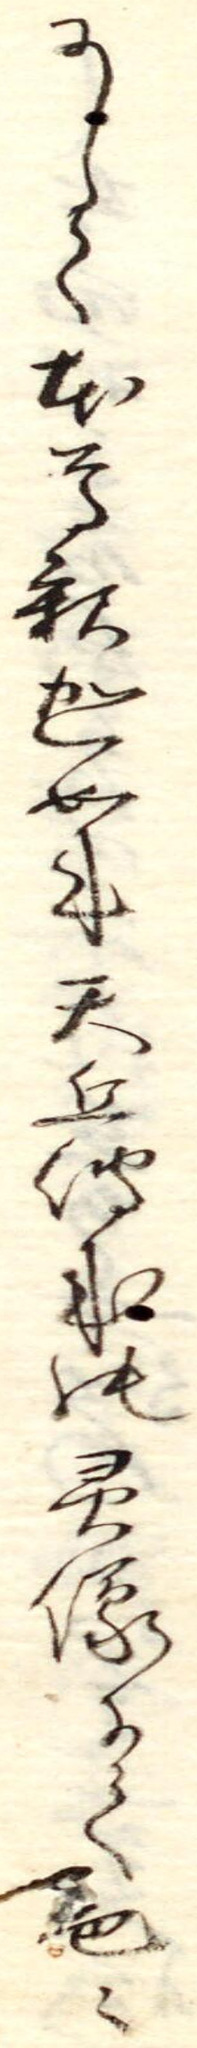にして本尊釈迦如来天丘伝来の霊像にて色々
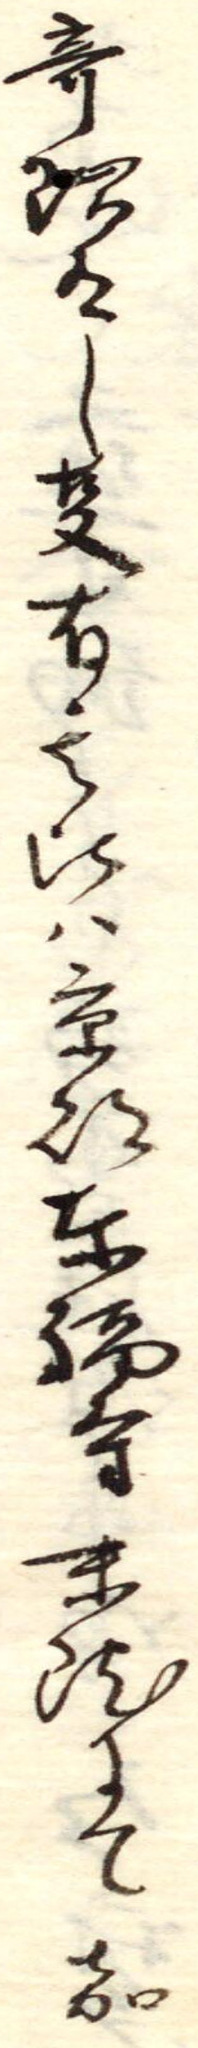奇瑞有し事有其比は京都東福寺末院にて嘉
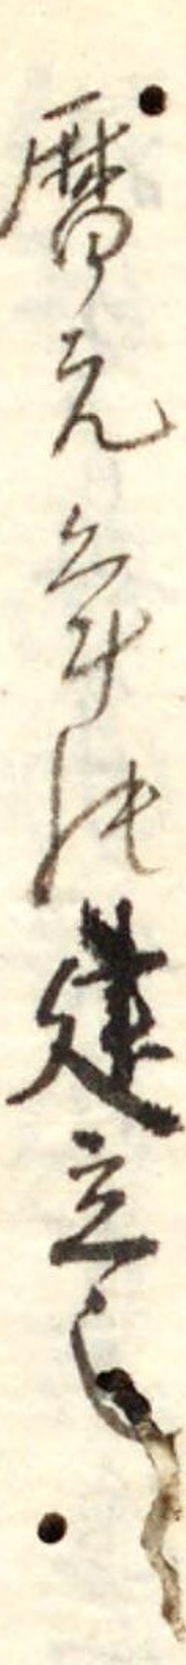暦元年の建立也
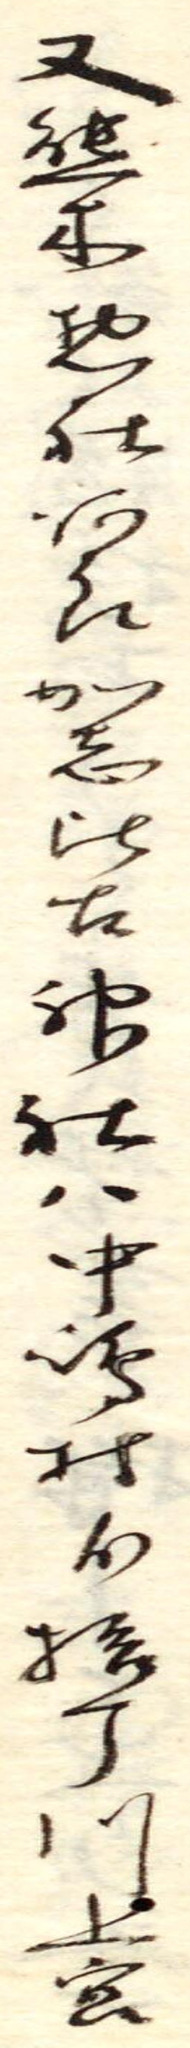又熊木惣社阿良加志比古神社は中嶋村ゟ拾丁川上宮
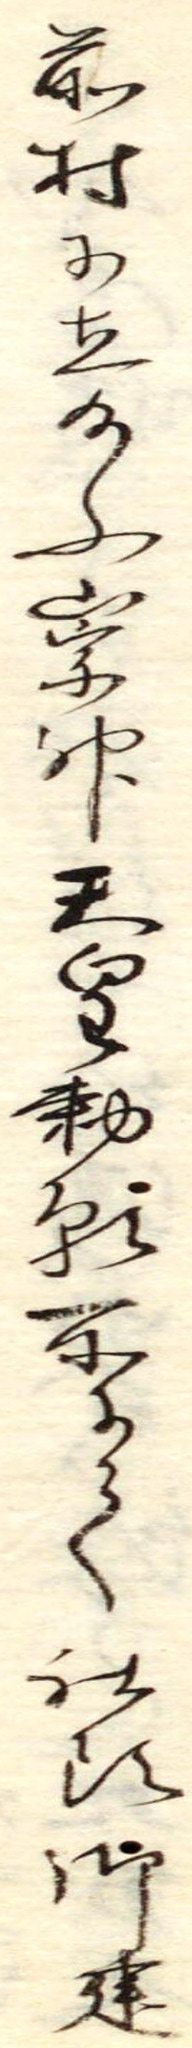前村に立給ふ崇神天皇勅願所にて社頭御建
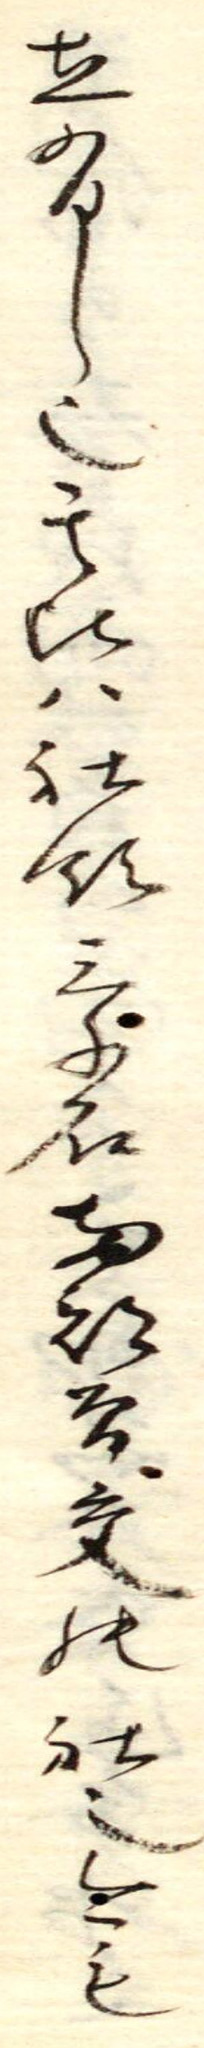立有し也其比は社領三千石両郡曽交の社也今も
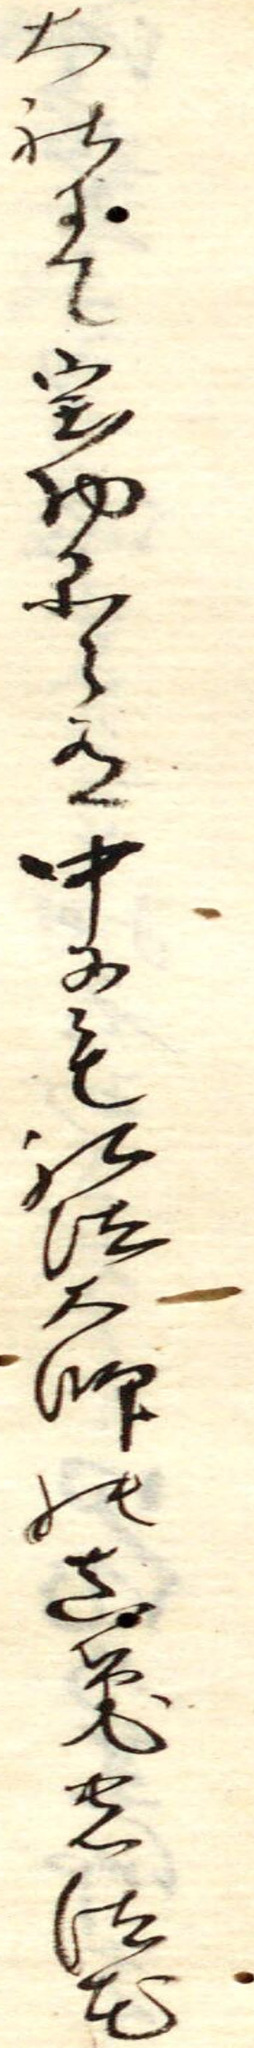大社にて宝物品々有中にも弘法大師の真筆の法花

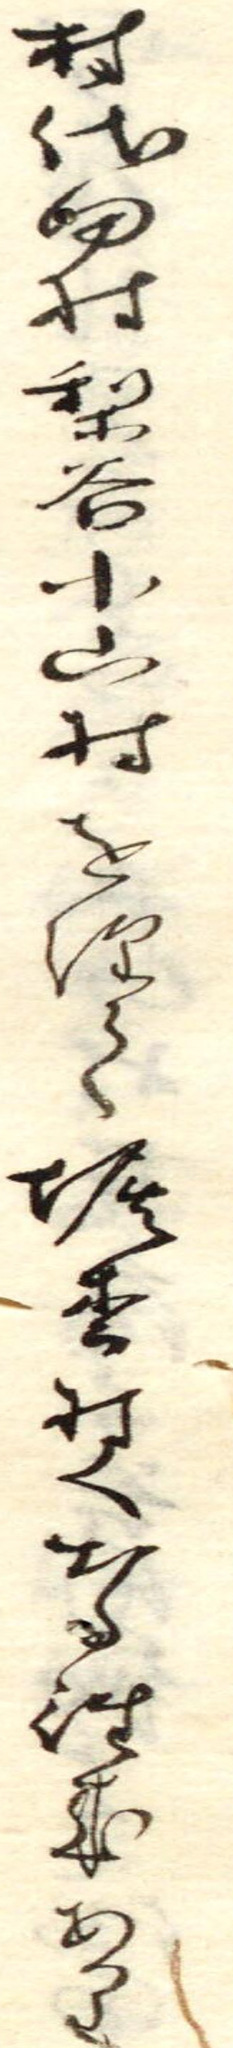村代田村梨谷小山村をへ経て堀枩村へ出る往来あり
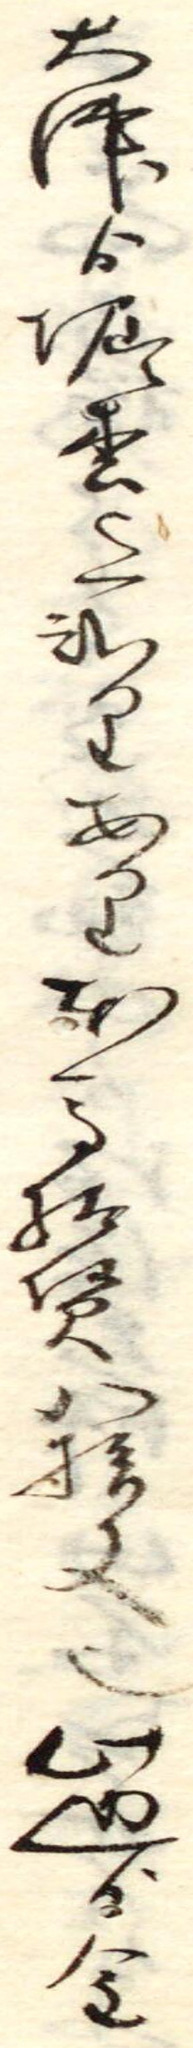大津ゟ堀枩迄弐里あり本馬駄賃八拾文也此辺ゟ金
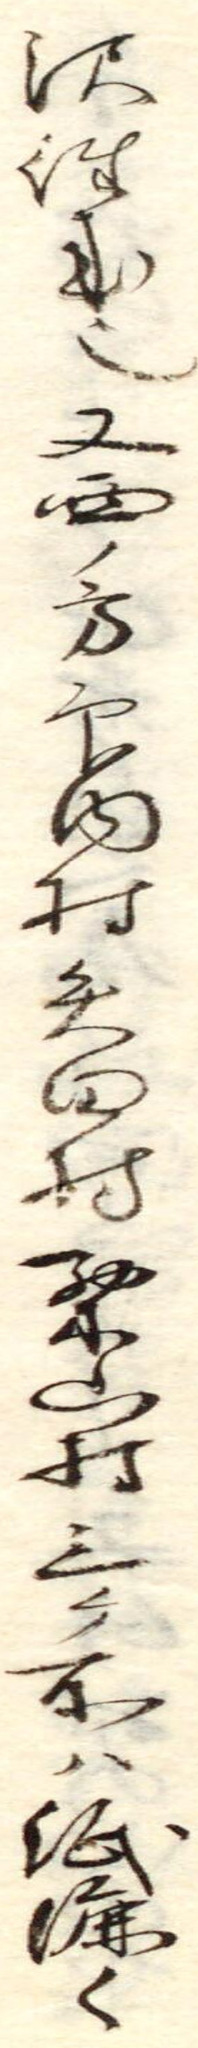沢往来也又西ノ方印内村八田村栗山村三ヶ所紙漉く
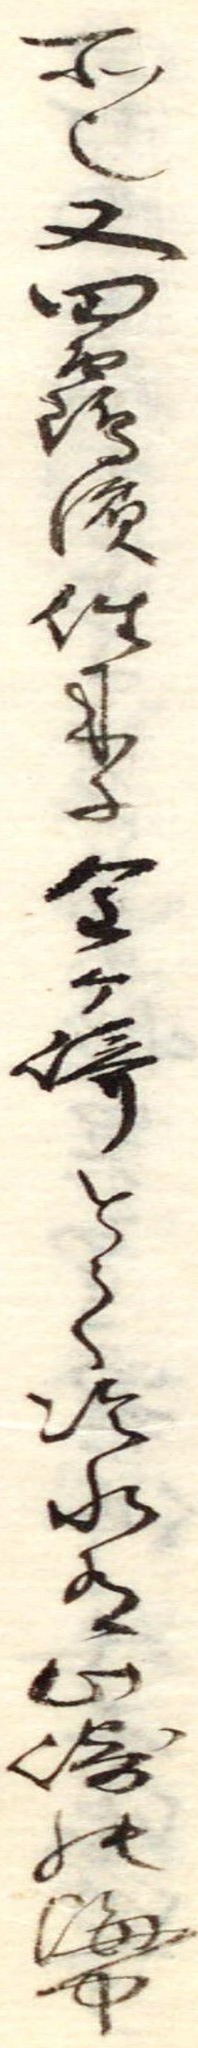所也又田鶴浜往来に金ヶ崎とて冷水有此崎の海中
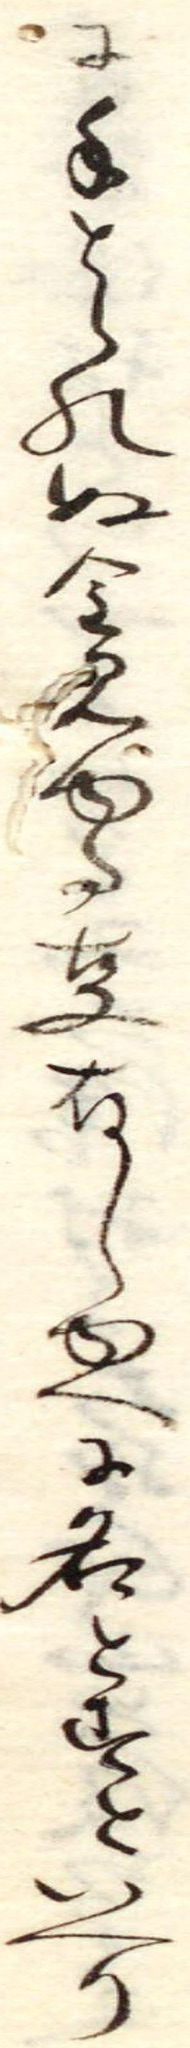に手とられぬ金未見ゆる事有しゆへに名とすといへり
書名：能登名跡誌
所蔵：Ishikawa Prefectural Library
